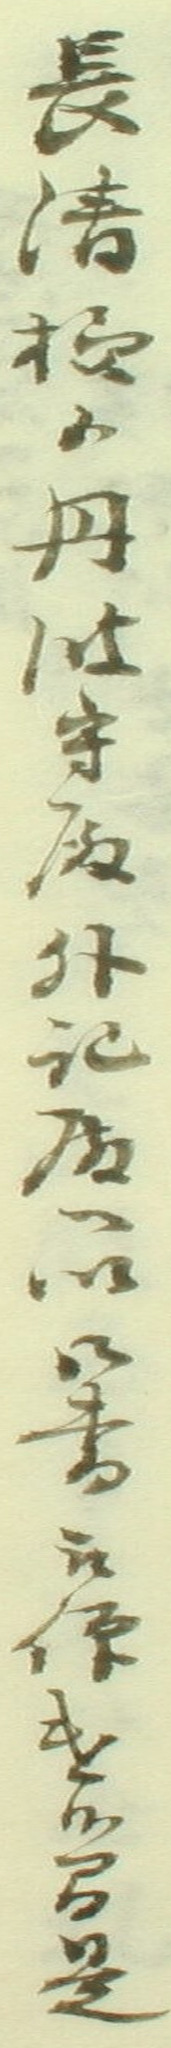長清様ゟ丹波守殿外記殿へ以御書被仰遣候間是
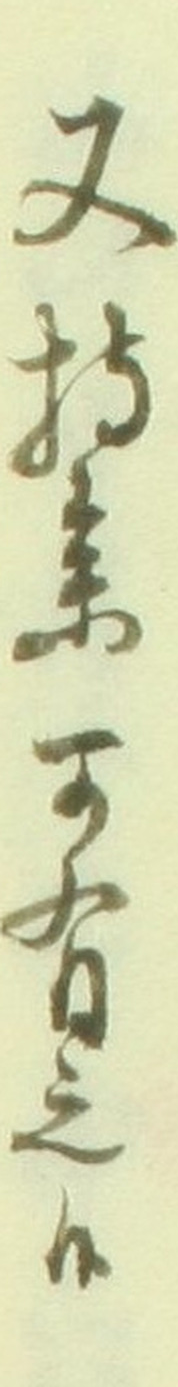又持参可有之候
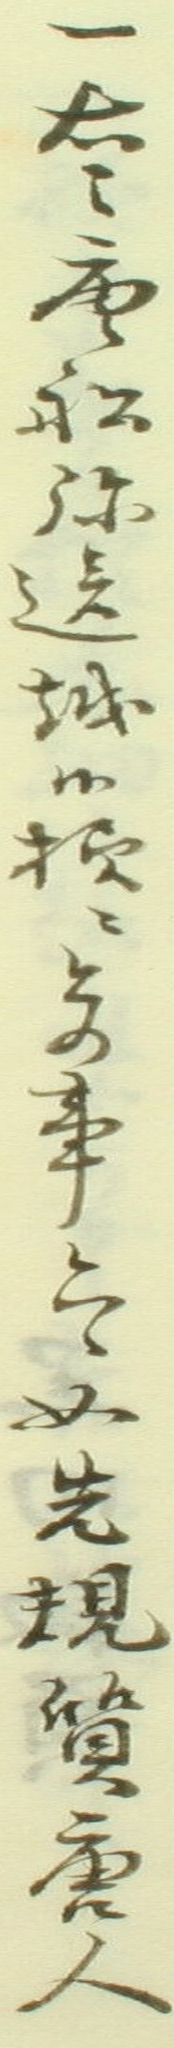一右之唐船弥送越候様にとの事候はゝ如先規質唐人
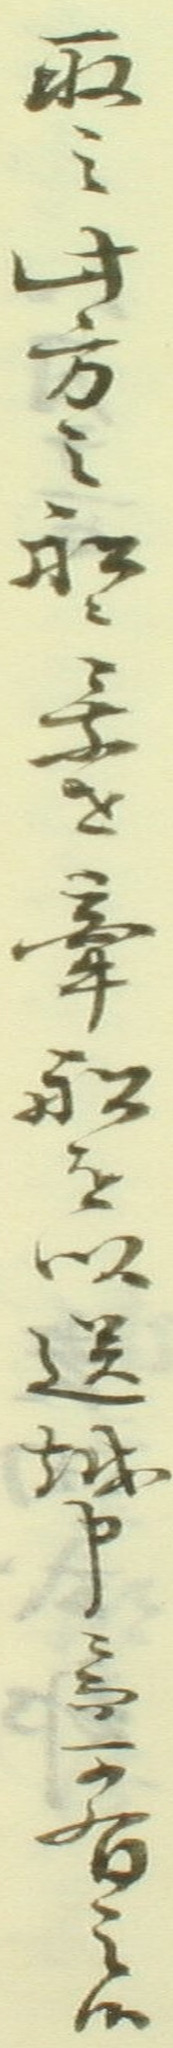取之此方之船に乗せ牽船を以送越申に而可有之候
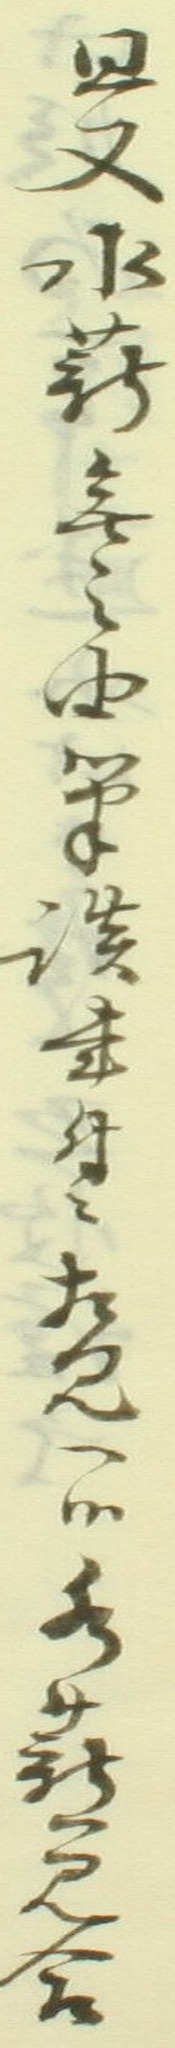且又水薪無之由筆談書付に相見へ候水薪へ見合
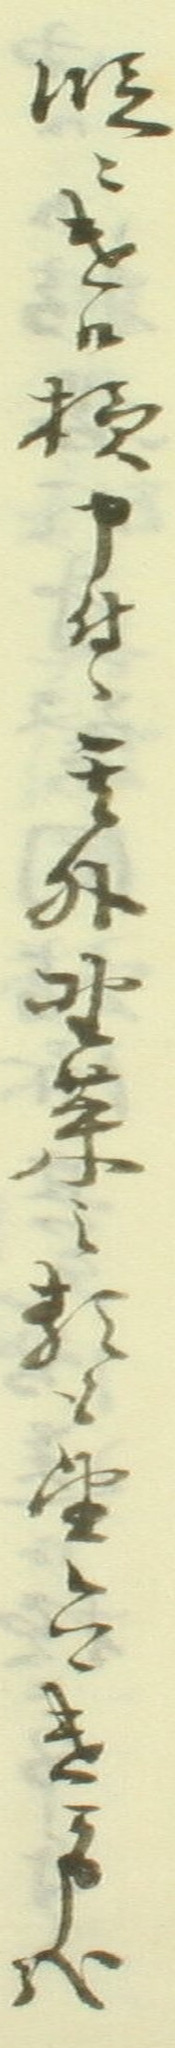段々遣候様申付候其外野菜之類も望候はゝ遣可申哉
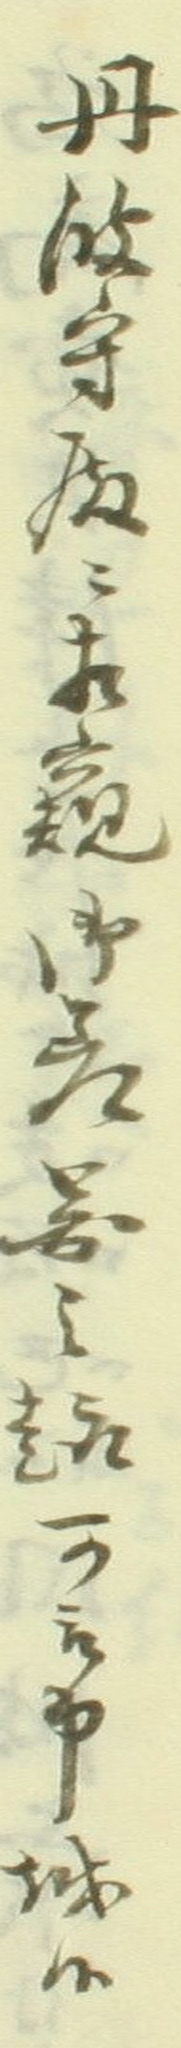丹波守殿に相窺御差図之趣可被申越候
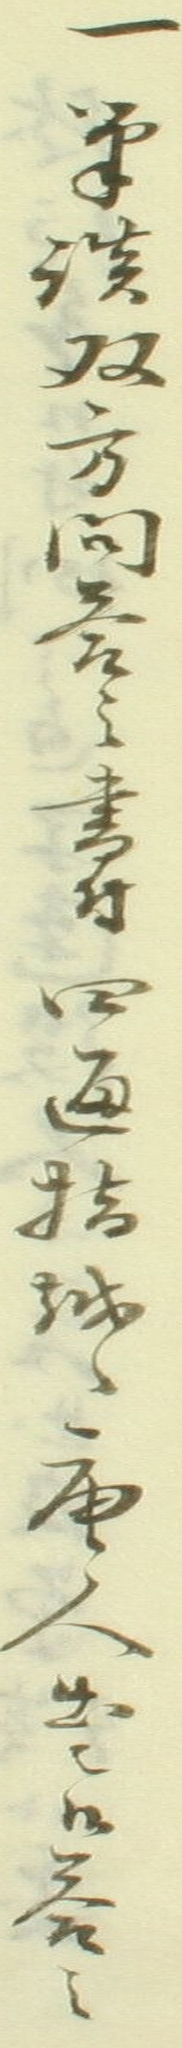一筆談双方問答之書付四通指越候唐人出し候答之
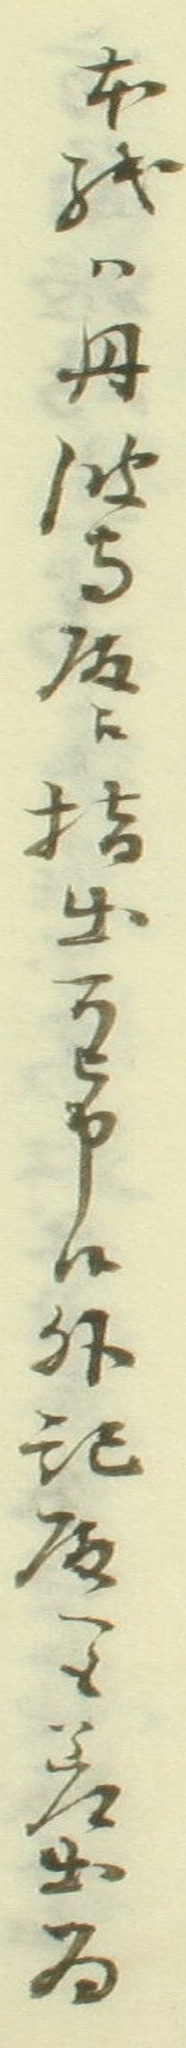本紙は丹波守殿え指出可被申候外記殿へも差出為
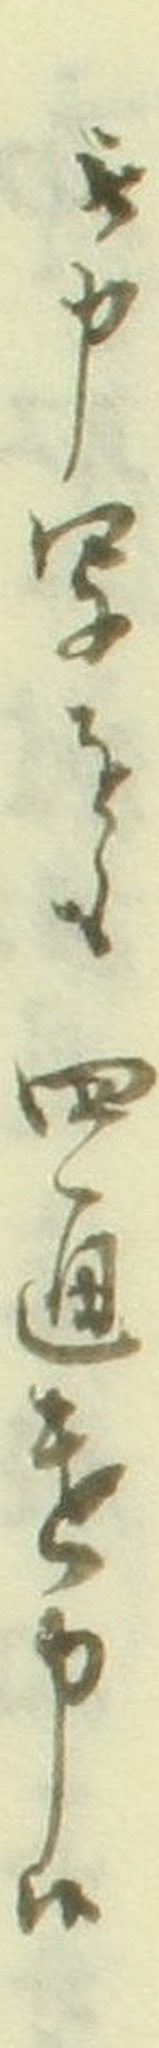被申写をも四通遣申候
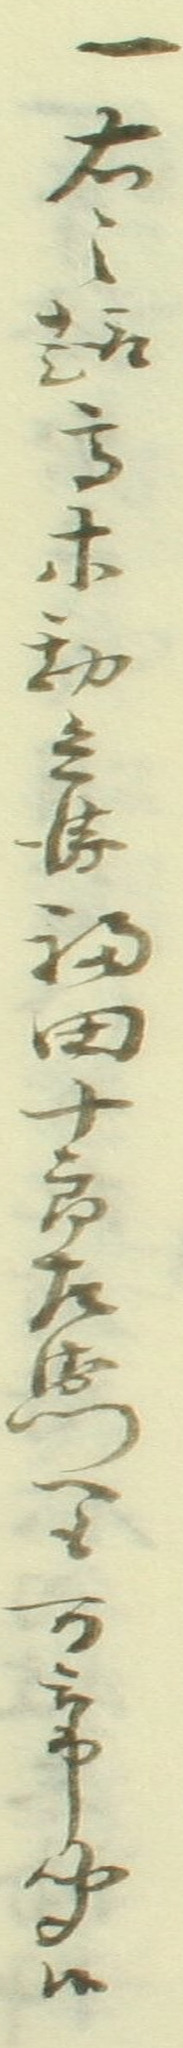一右之趣高木勘兵衛福田十郎左衛門へも可被申聞候
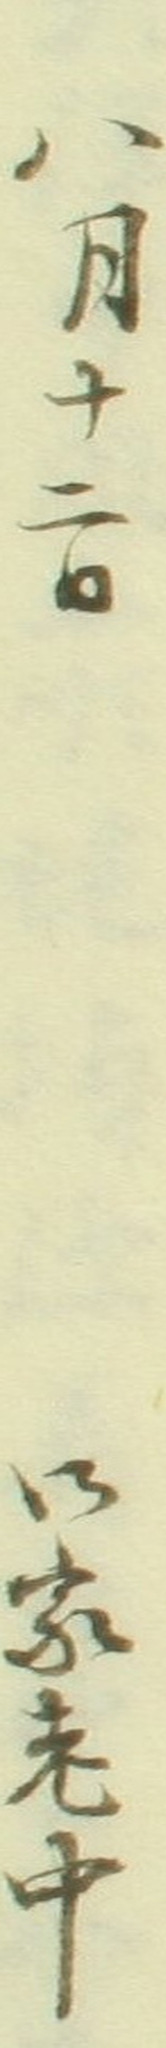八月十二日御家老中

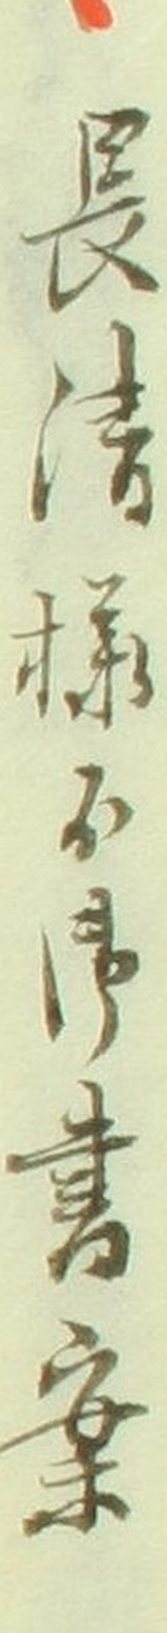長清様ゟ御書案
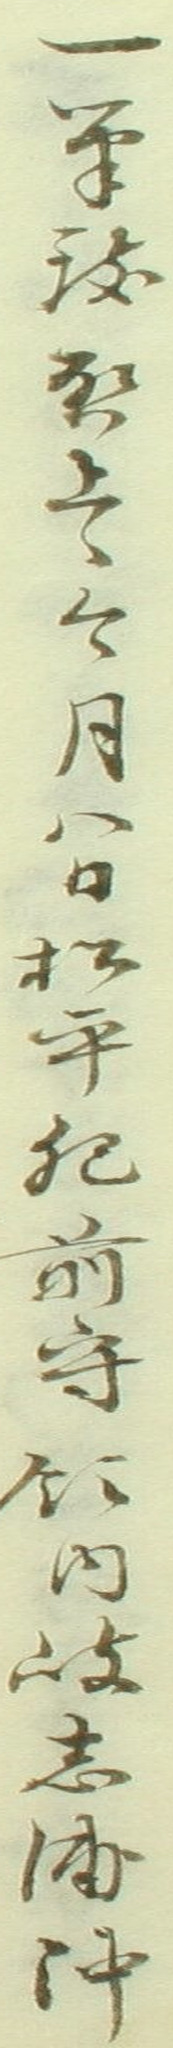一筆致啓上候今月八日松平肥前守領内岐志浦沖
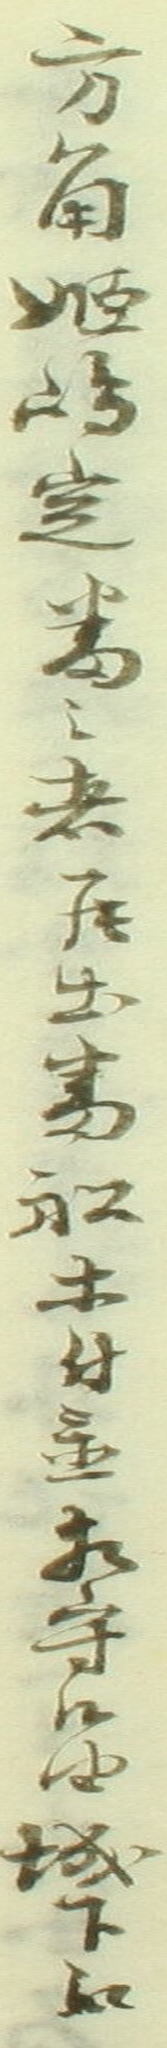方角姫島定番之者罷出番船等付置相守候由城下え
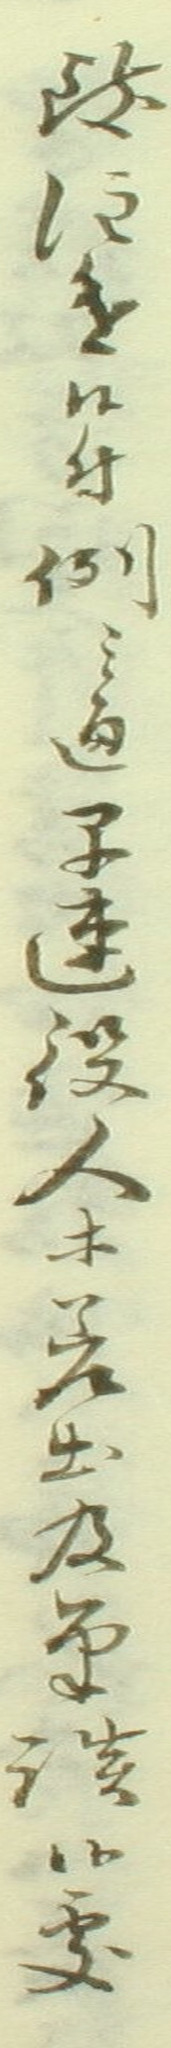致注進候付例之通早速役人等差出及筆談候処
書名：異国船漂着記
